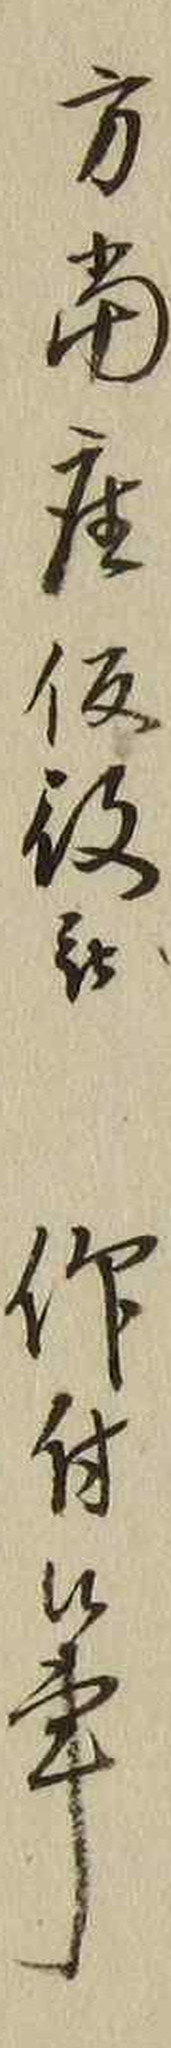方当座仮役被仰付候事
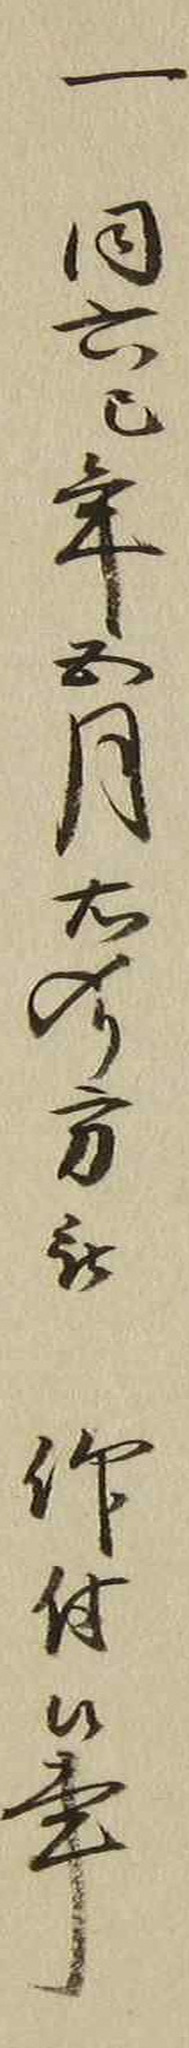一同六巳年五月右〆り方被仰付候事
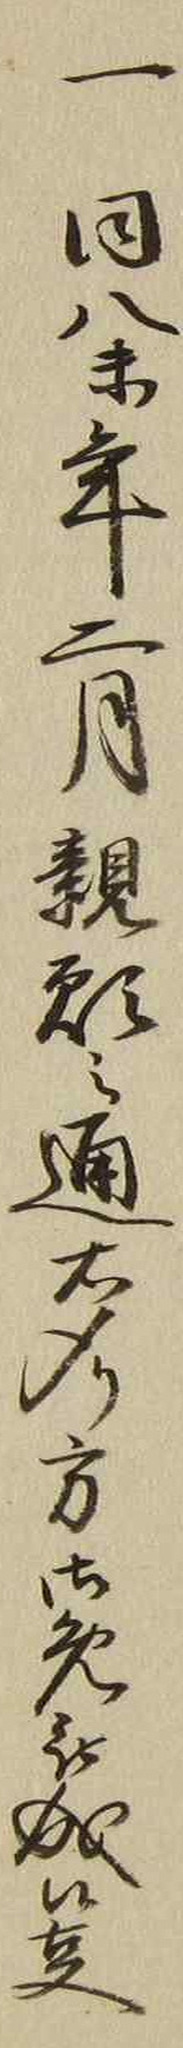一同八未年二月親願之通右〆り方御免被成候事
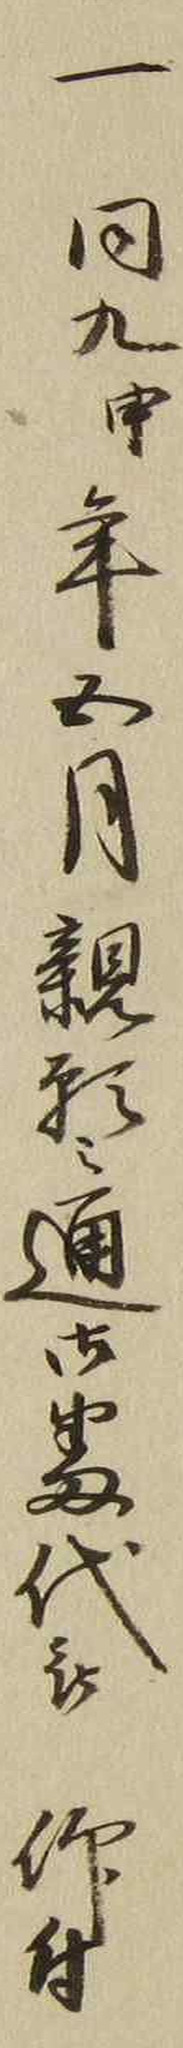一同九申年五月親願之通御番代被仰付
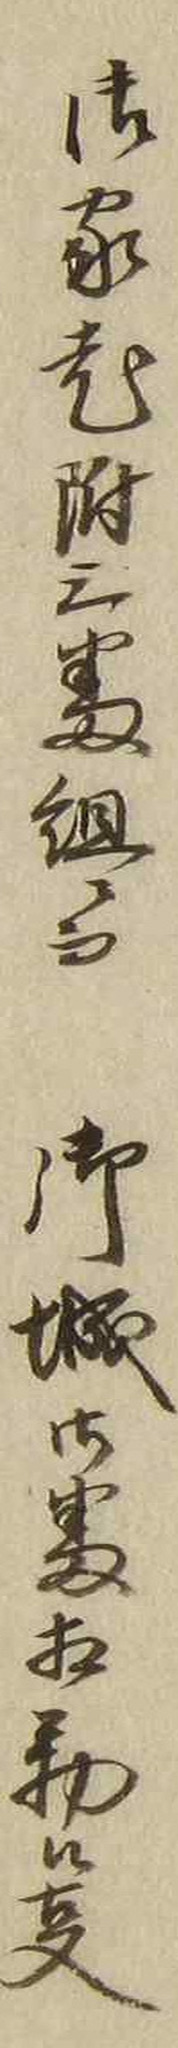御家老附三番組ニ而御城御番相勤候事

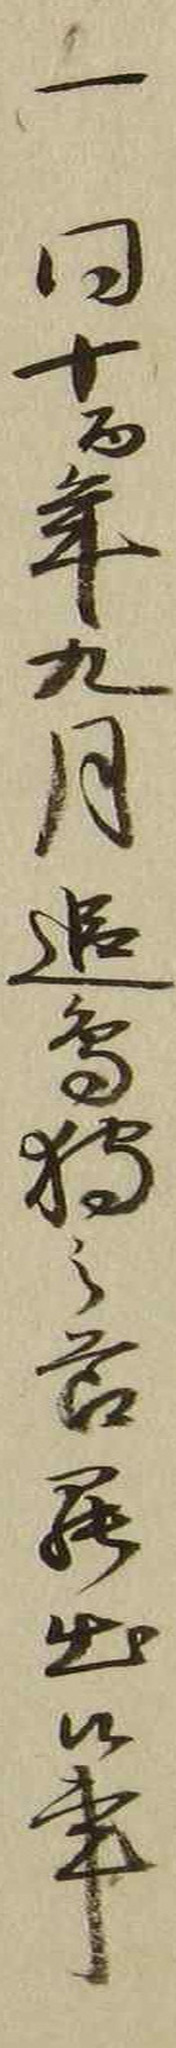一同十酉年九月追鳥狩之節罷出候事
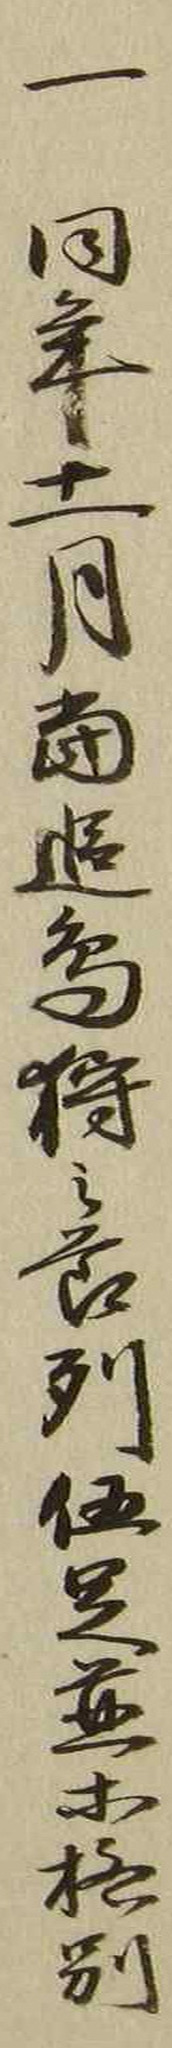一同年十一月当追鳥狩之節列伍是並等格別
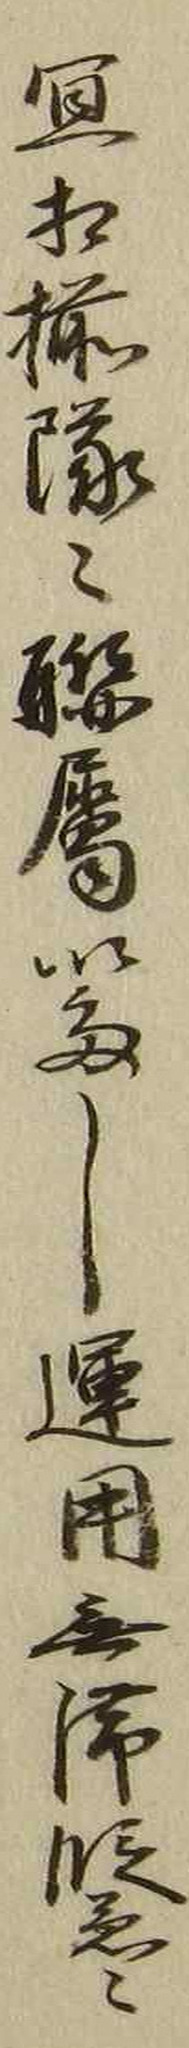宜相揃隊々聯属いたし運用無滞段兼々
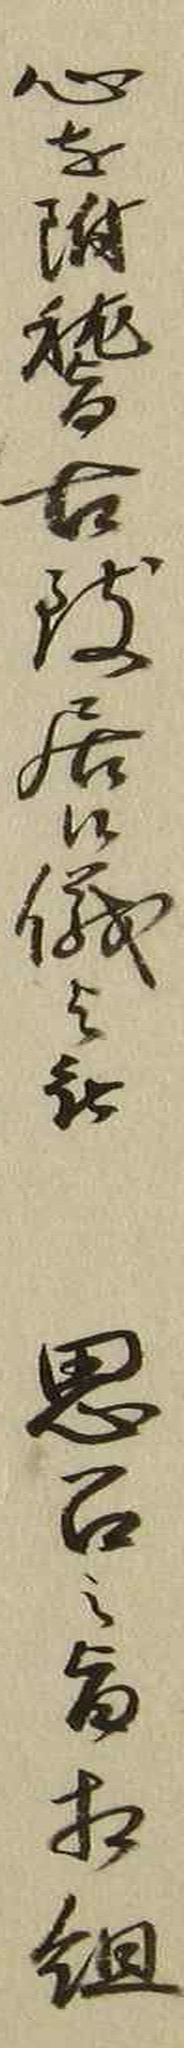心を附稽古致居候儀与被思召之旨相組
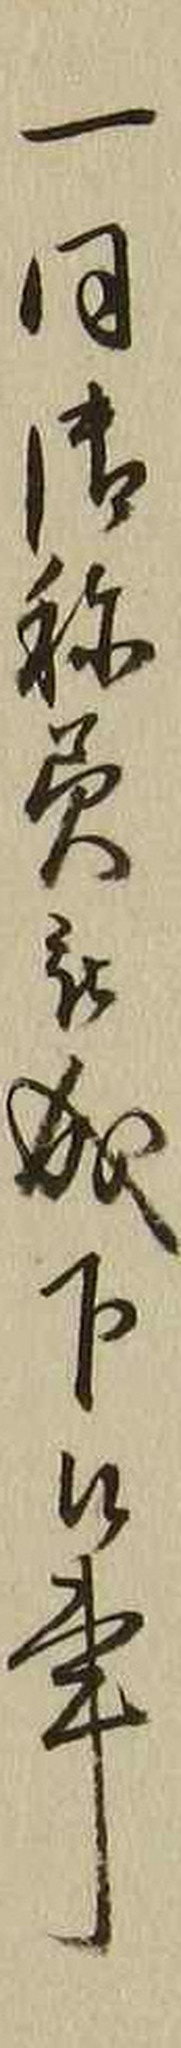一同御称美被成下候事
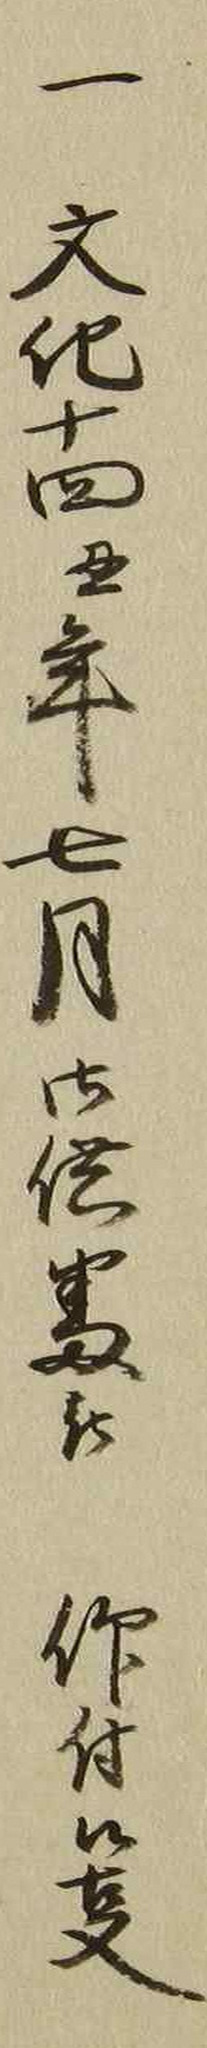一文化十四丑年七月御供番被仰付候事
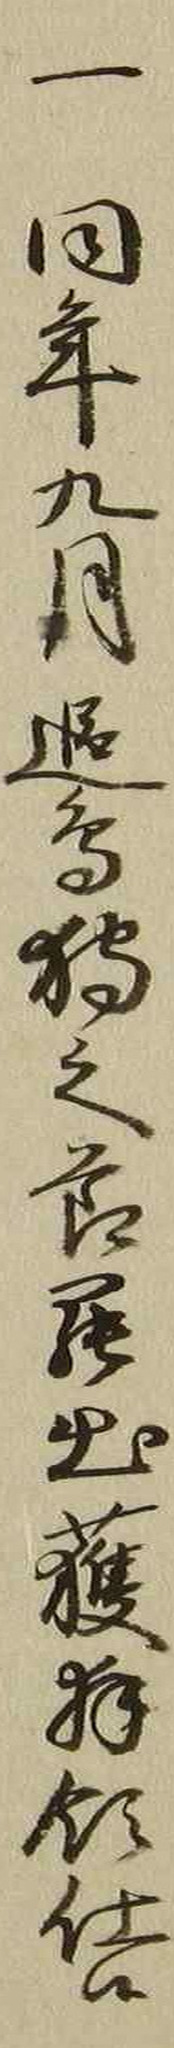一同年九月追鳥狩之節罷出獲拝領仕候
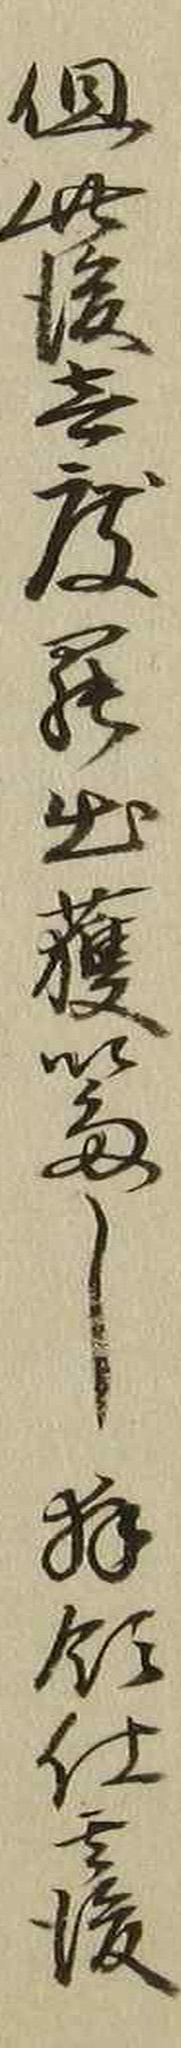但此後壱度罷出獲いたし拝領仕其後
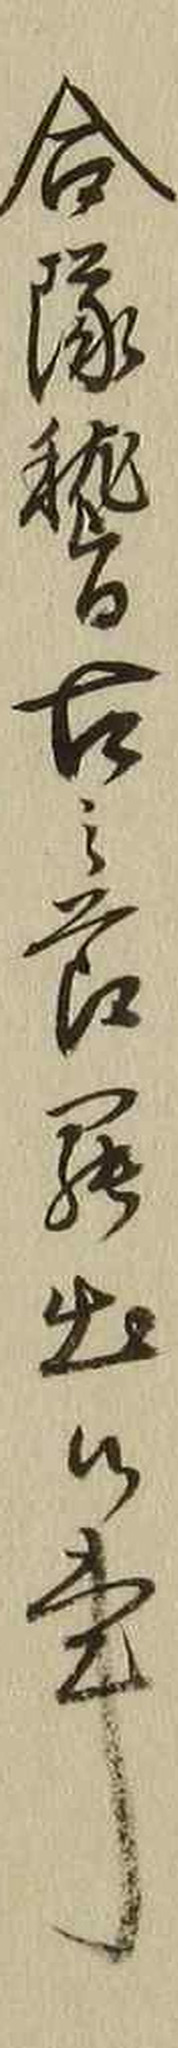合隊稽古之節罷出候事
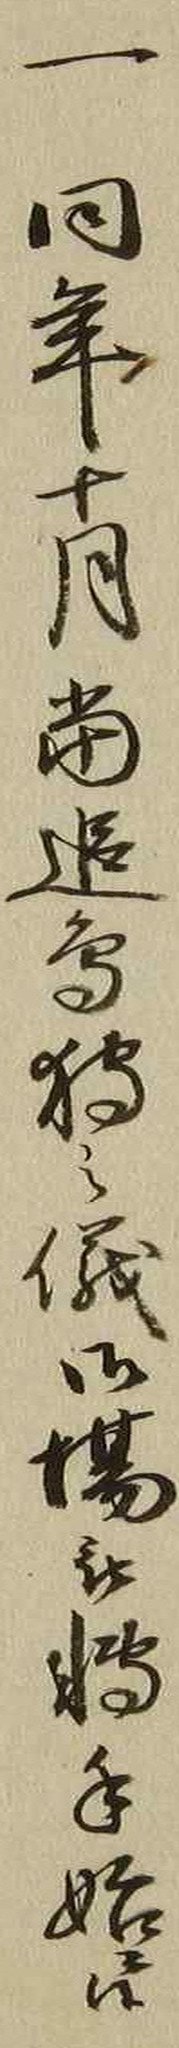一同年十月当追鳥狩之儀御場被転手始ニ候
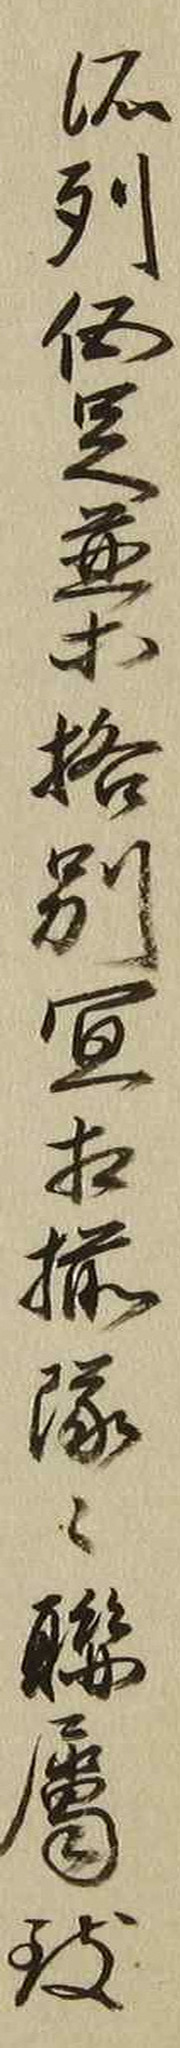所列伍足並等格別宜相揃隊々聯属致
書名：諸士系譜　巻之128　た之部4
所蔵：会津若松市立会津図書館
